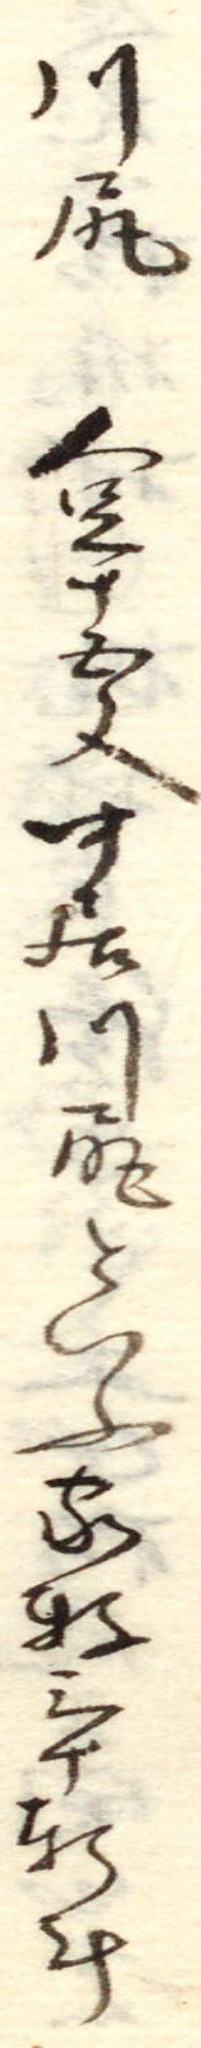川尻人足十五文中居川尻といふ家数三十軒杜斗
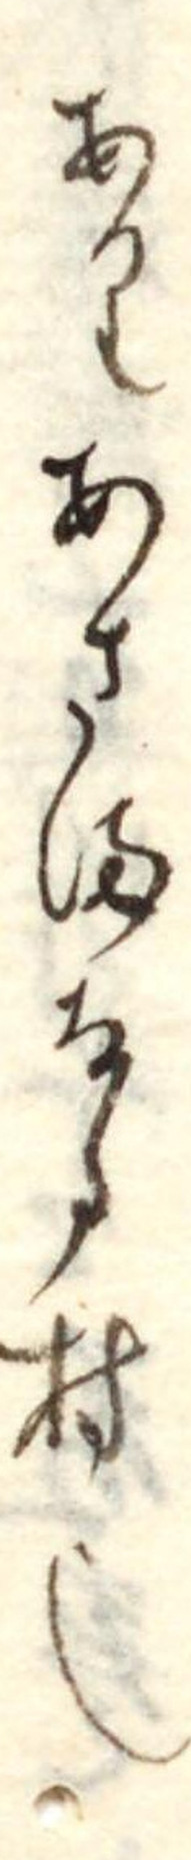ありあさまなる村也
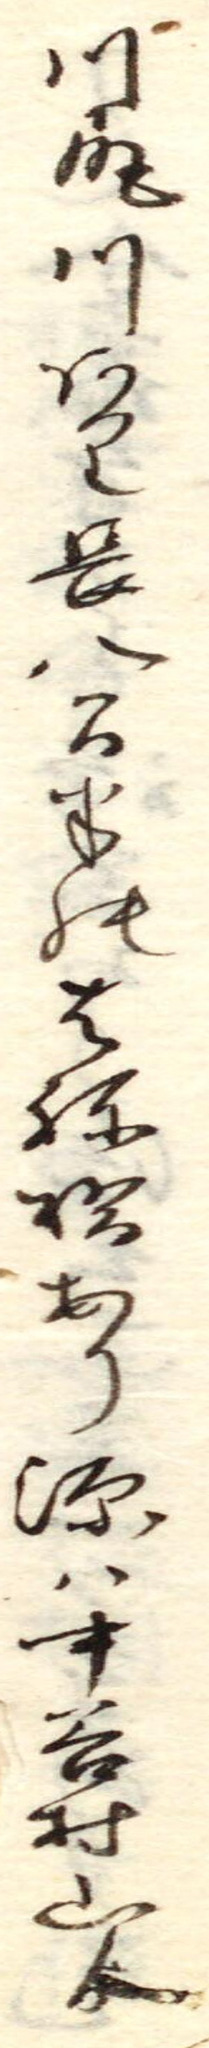川尻川あり長八間半のはね橋あり源は中谷村山ゟ
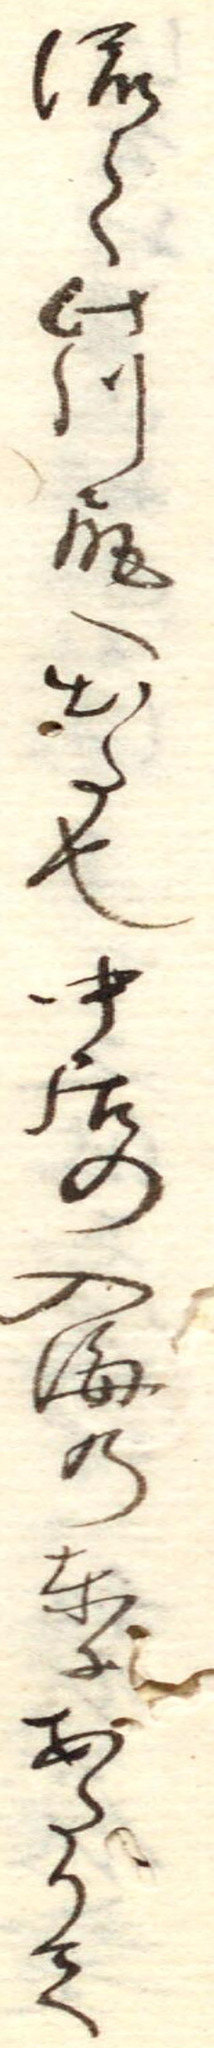流て此川尻へ出る也中居の入海の東にあたりて
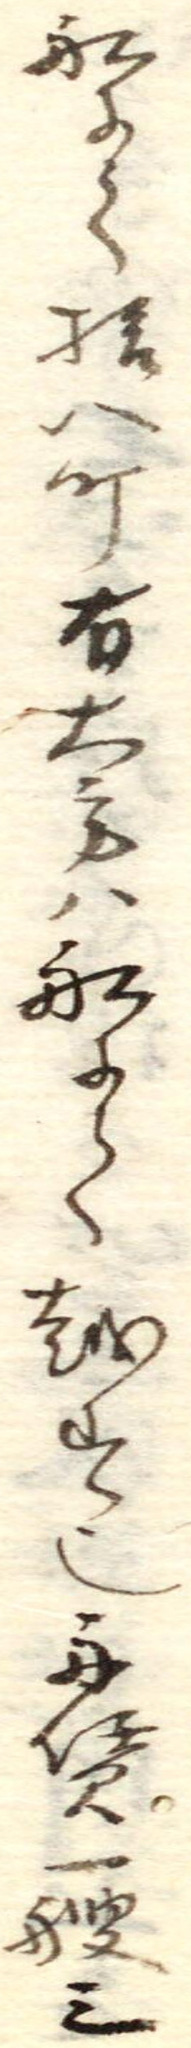船にて拾八町有大方は船にて越す也舟賃は一艘三
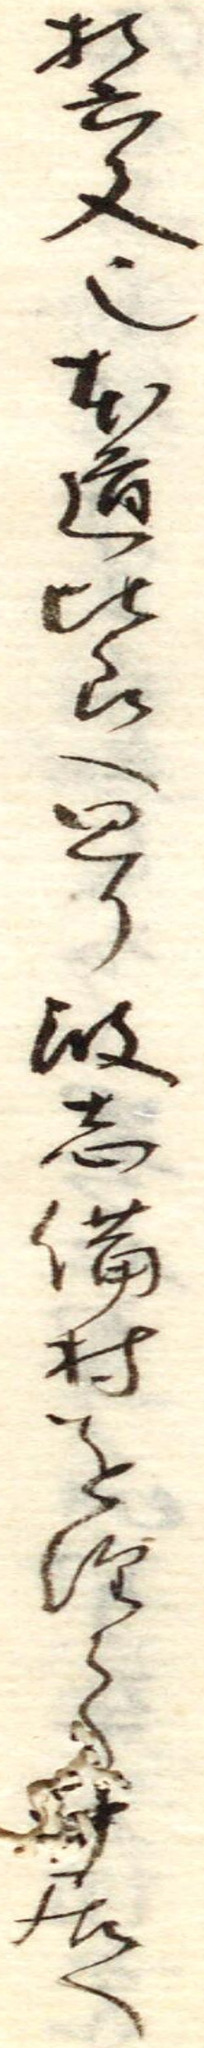拾六文也本道比良へ廻り波志備村を経て中居へ
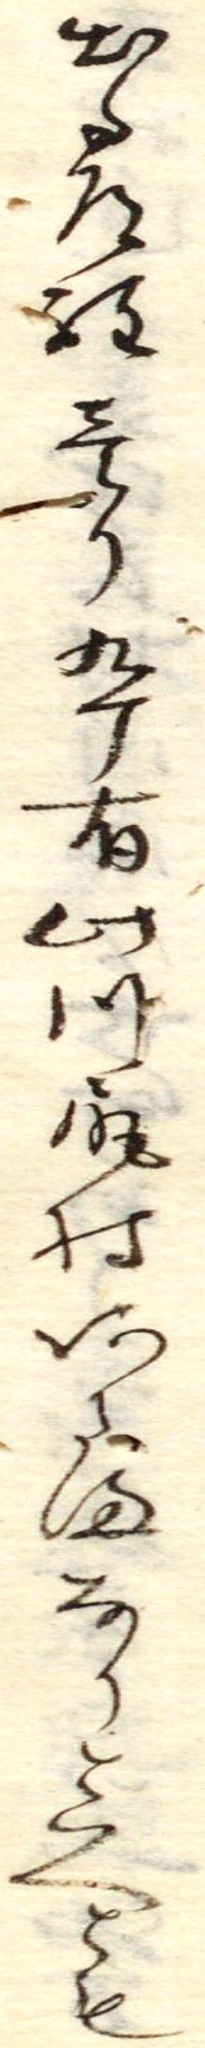出る道程壱り九丁有此川尻村あたまなりといへとも
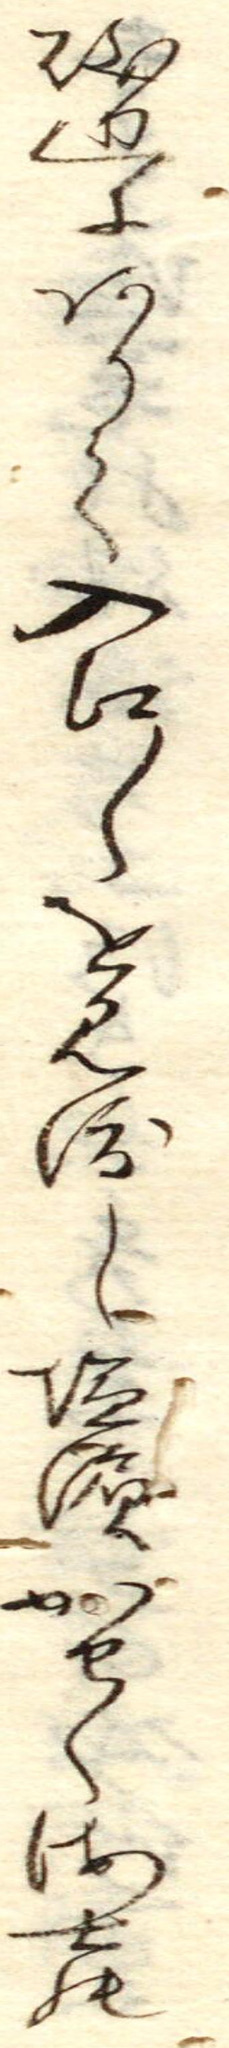礒辺にありて入江〳〵を見渡し塩浜かせく海士の
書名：能登名跡誌
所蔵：Ishikawa Prefectural Library
